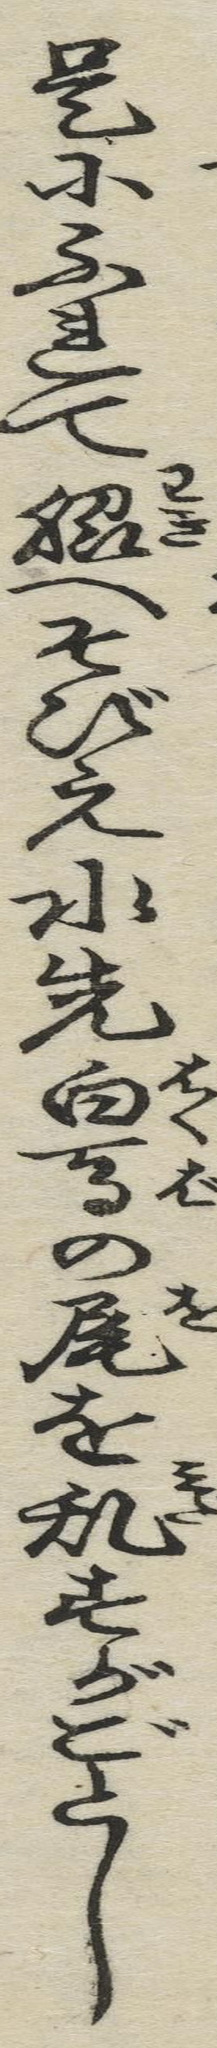是にふれて脇へそびえ水先白馬の尾を乱すがごとし
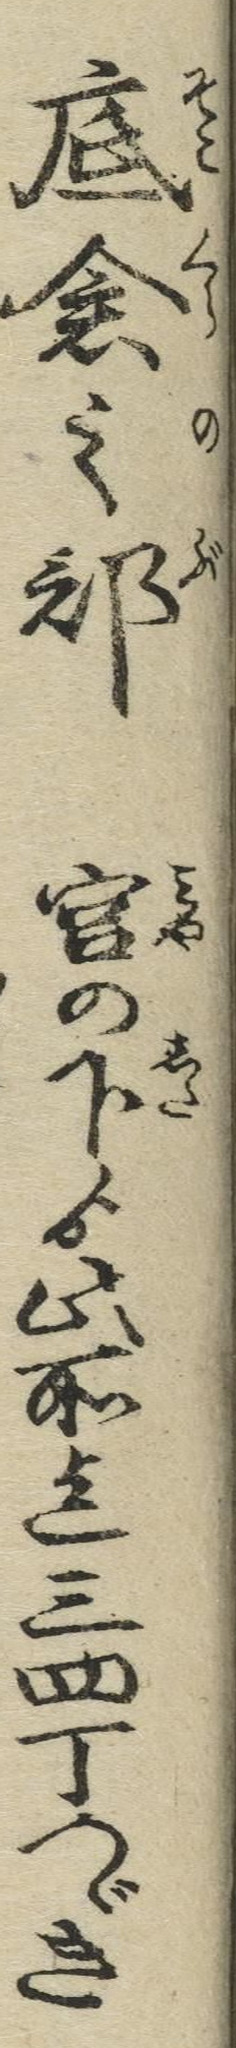底倉之部宮の下より此所迄三四丁つゞき
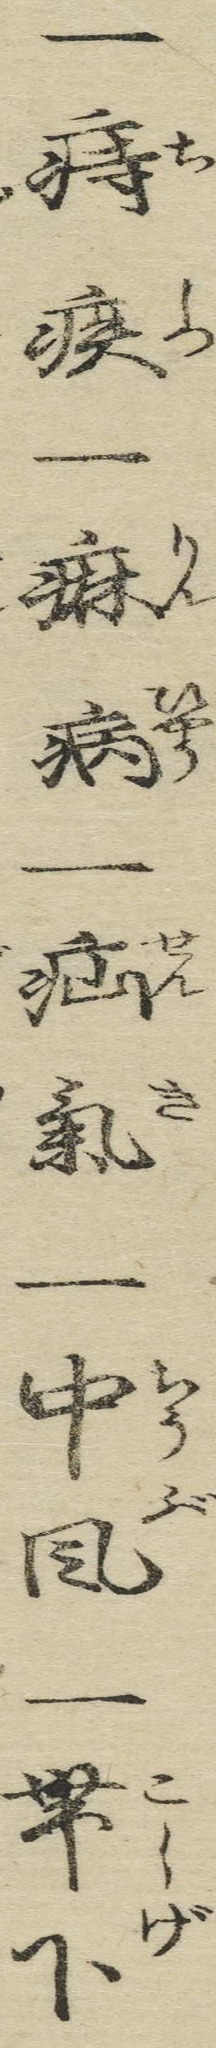一痔疾一痳病一疝氣一中風一帯下
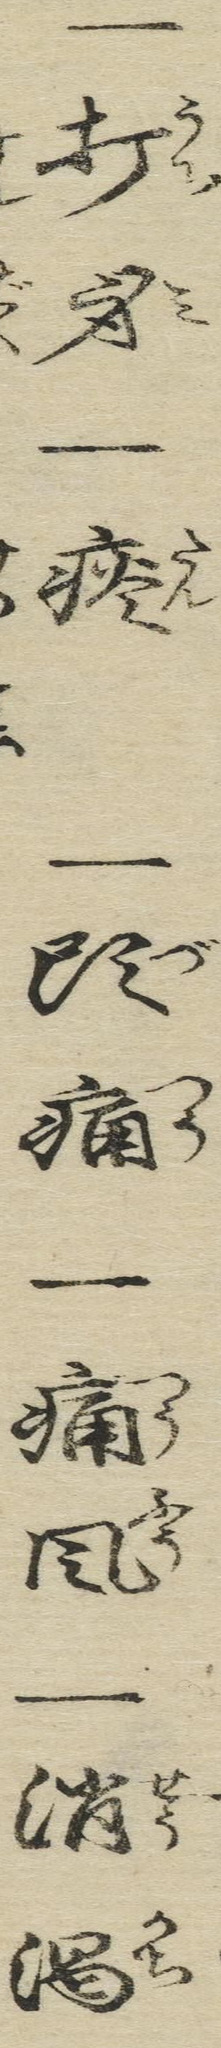一打身一痰一頭痛一痛風一消渇
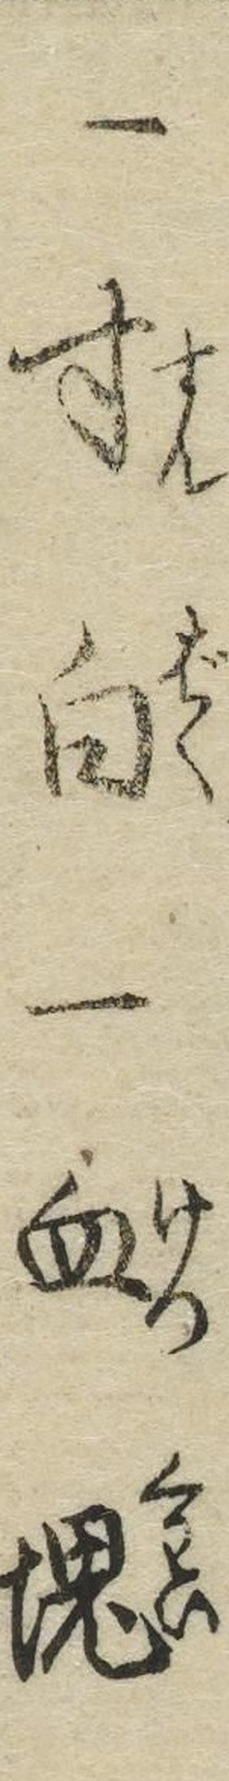一寸白一血塊
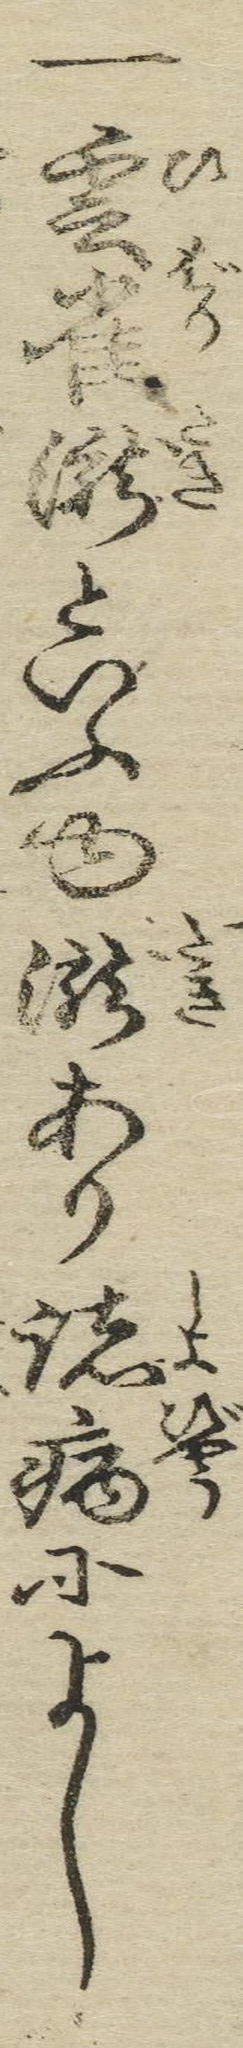一雲雀瀧といふゆ瀧あり諸病によし
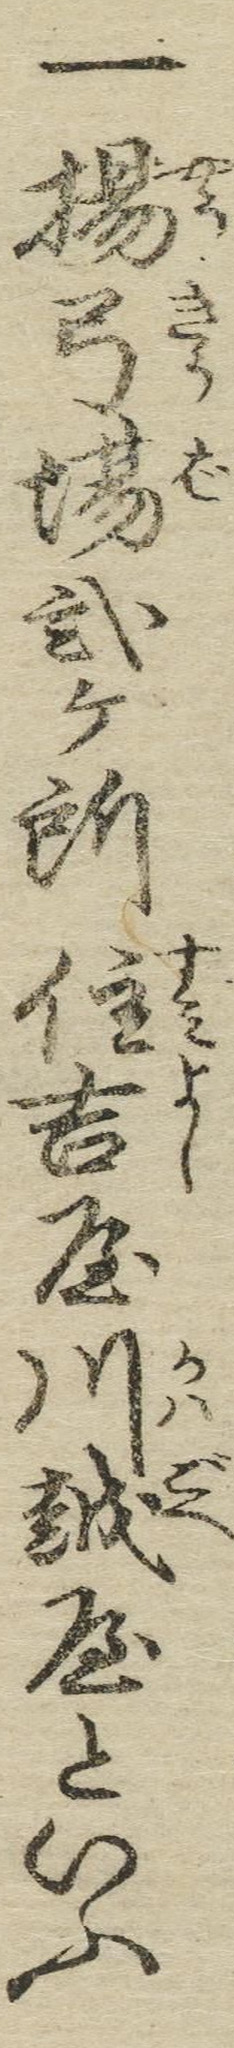一楊弓場弐ヶ所住吉屋川越屋といふ
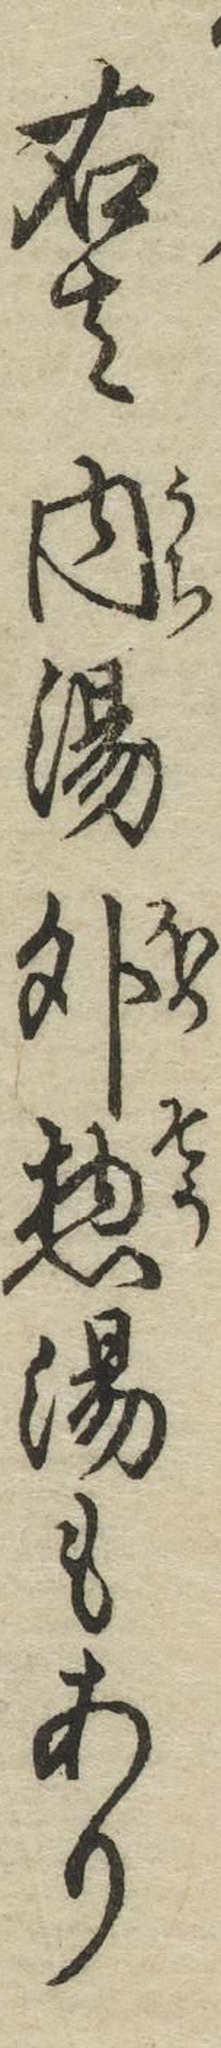右は内湯外惣湯もあり
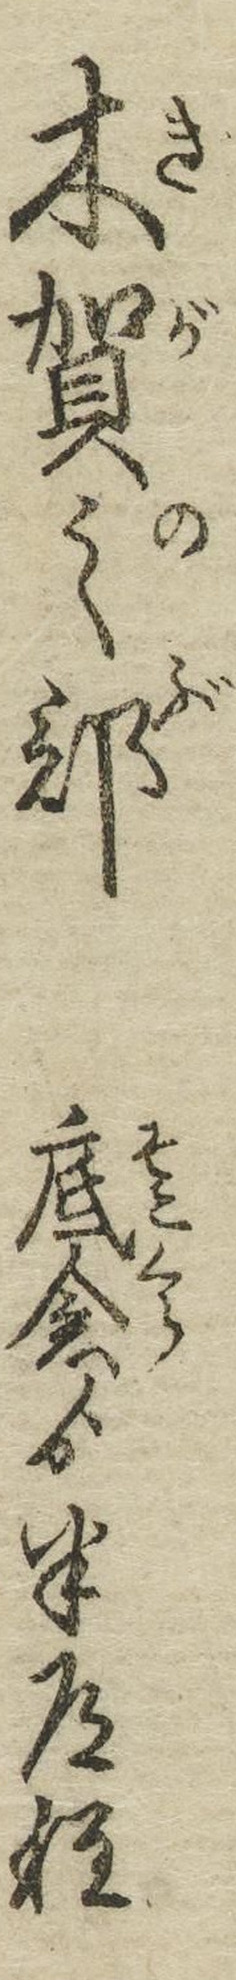木賀之部底倉より半屋程
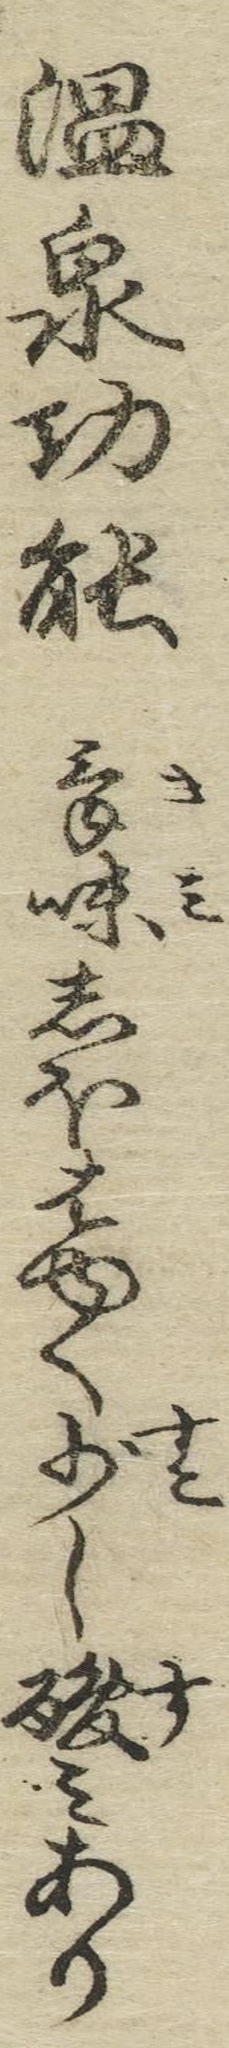温泉効能氣味しほはゆく少し酸みあり

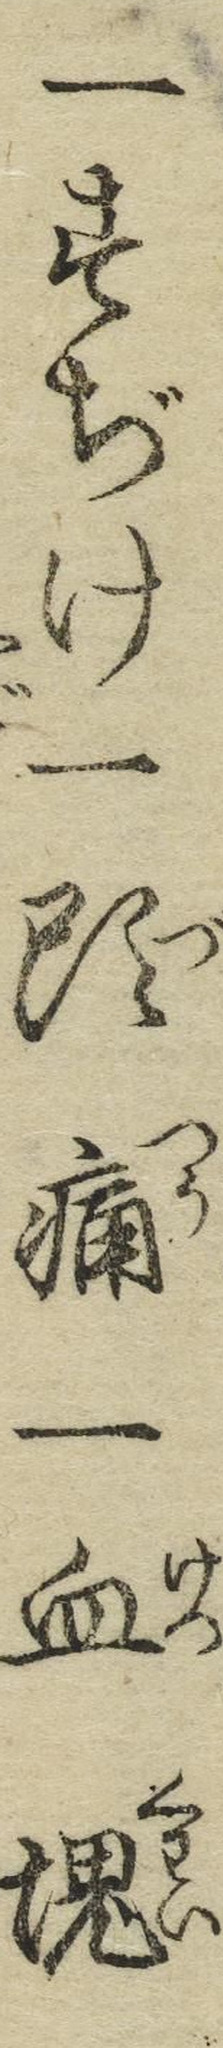一すぢけ一頭痛一血塊
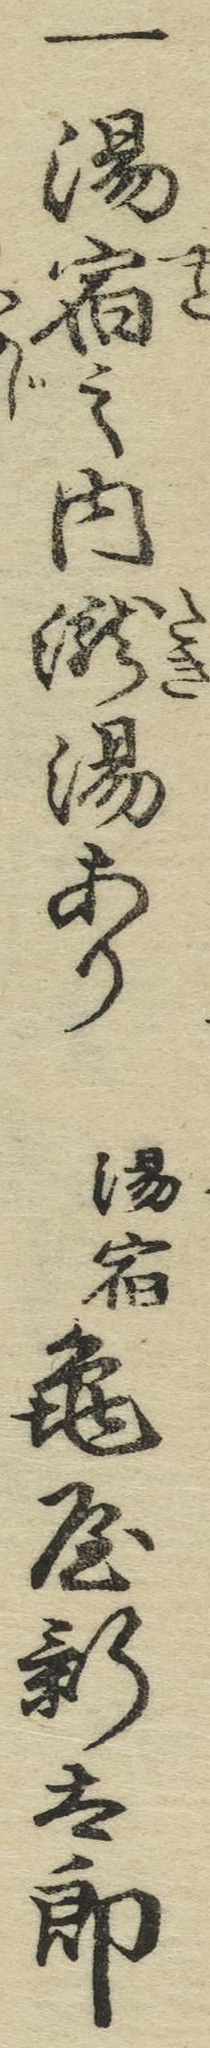一湯宿の内瀧湯あり湯宿亀屋新太郎
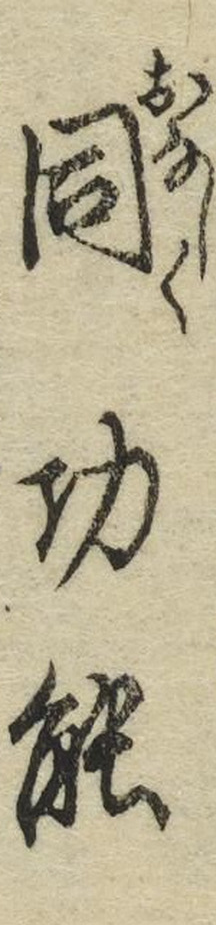同功能
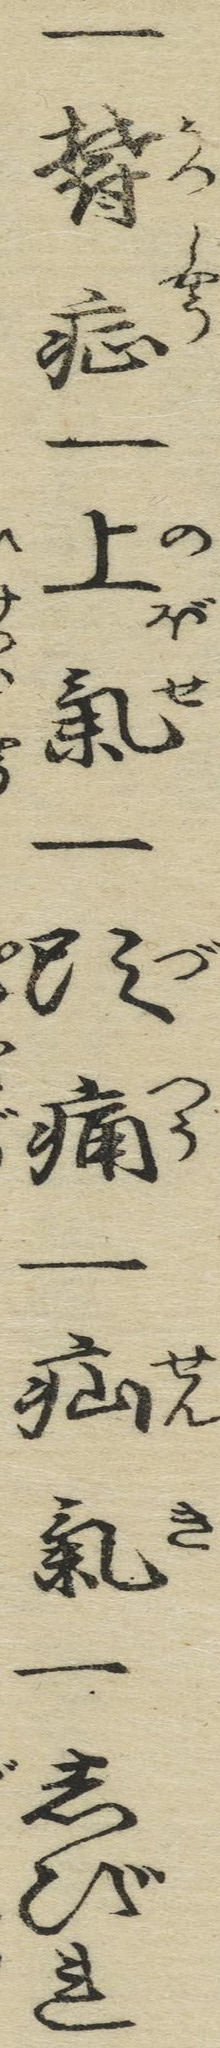一鬱症一上氣一頭痛一疝氣一しびれ
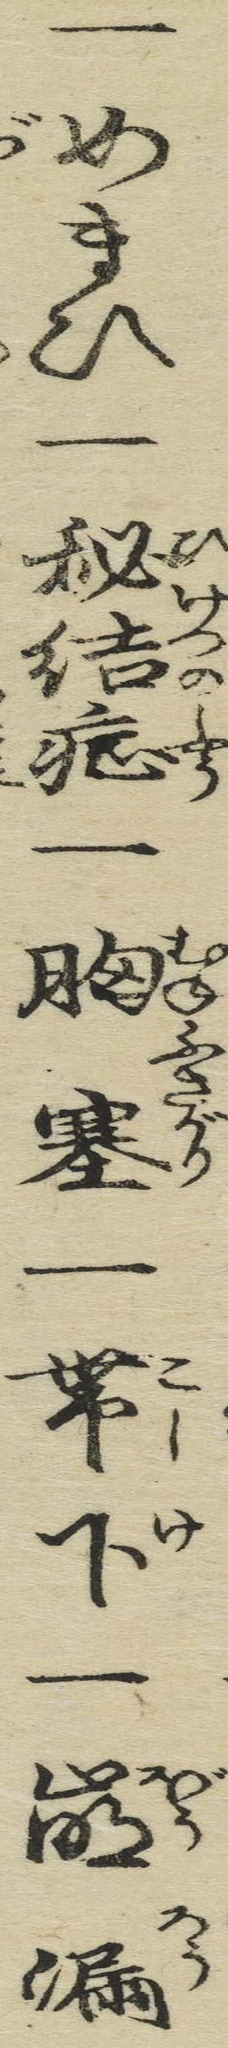一めまひ一秘結症一胸塞一帯下一崩漏
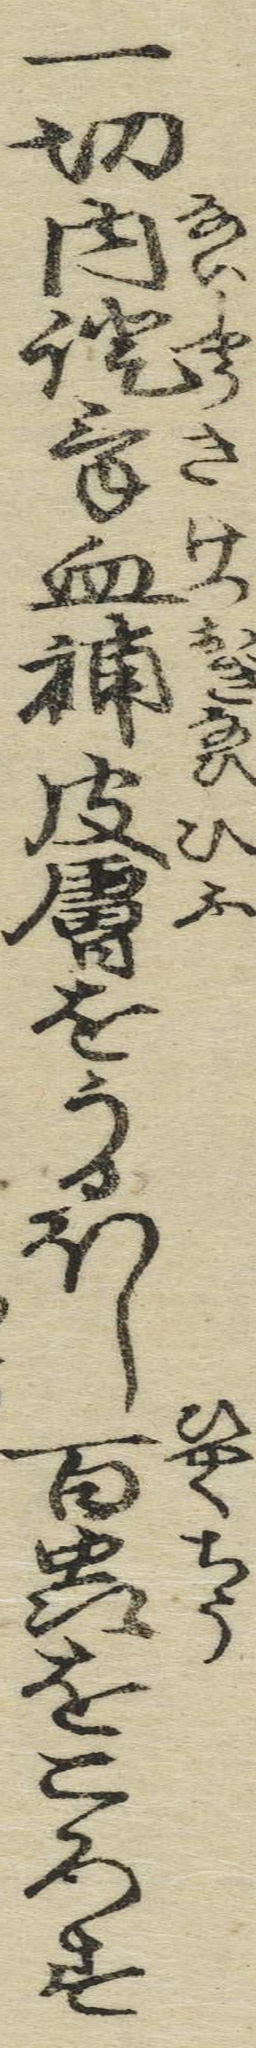一切内證氣血補皮膚をうるほし百虫をころす
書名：箱根七湯　温泉圖會　全
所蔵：東京大学地震研究所図書室 Earthquake Research Institute Library, The University of Tokyo, JAPAN
